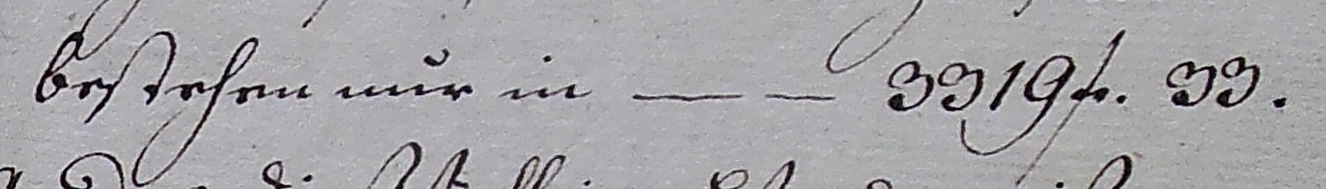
bestehen nur in __ __ 3319fr. 33.
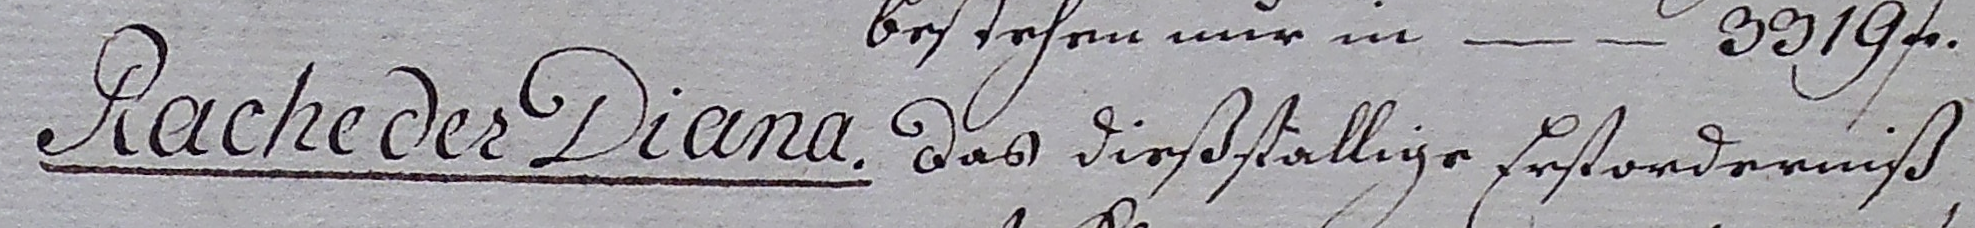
Rache der Diana. Das dießfällige Erforderniß
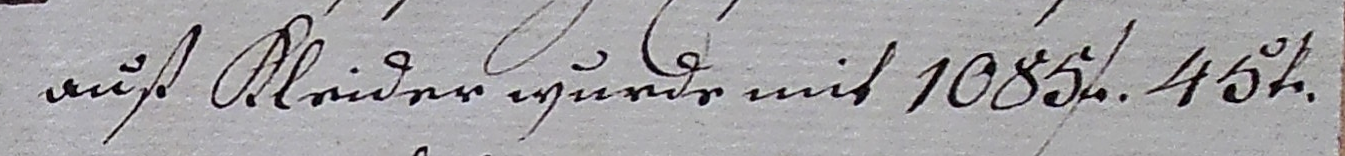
auf Kleider wurde mit 1085fr. 45kr.
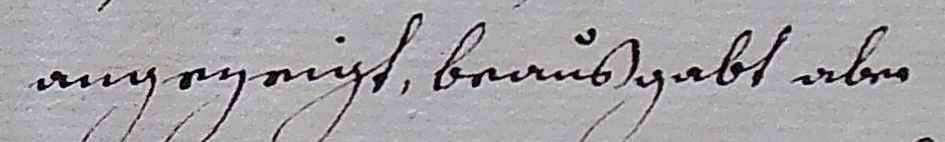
angezeigt, beausgabt aber
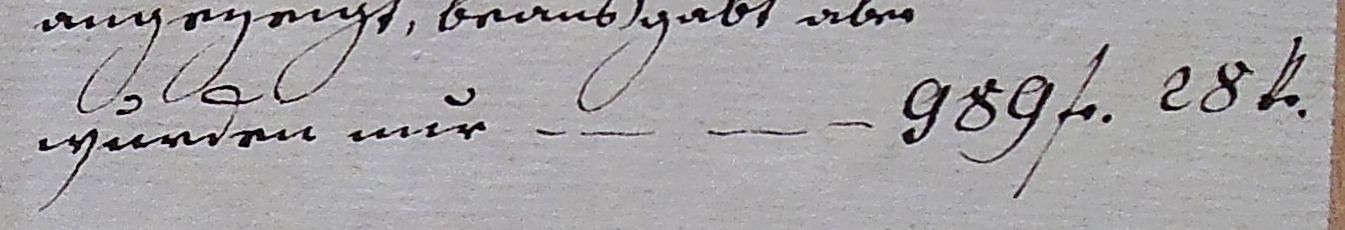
wurden nur _ __ __ _ 989fr. 28kr.
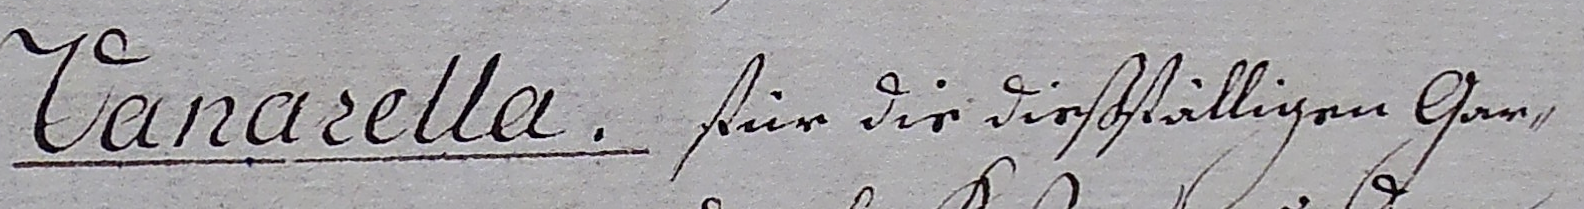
Venarella. für die dießfälligen Gar¬
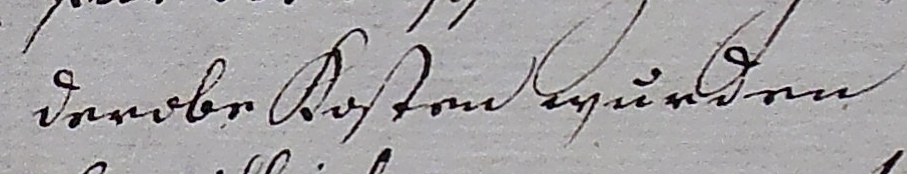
derobe Kosten wurden
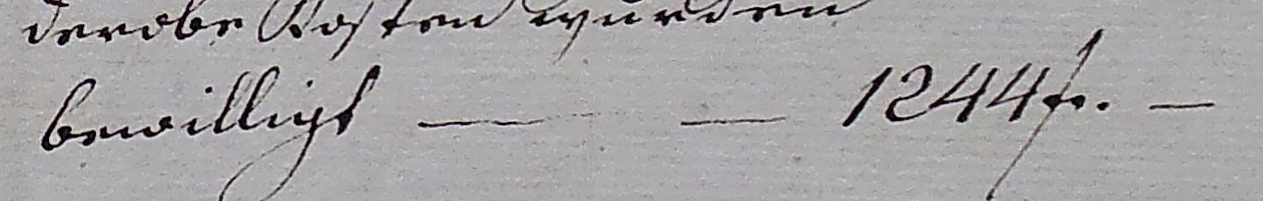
bewilligt ___ ___ 1244fr. ---
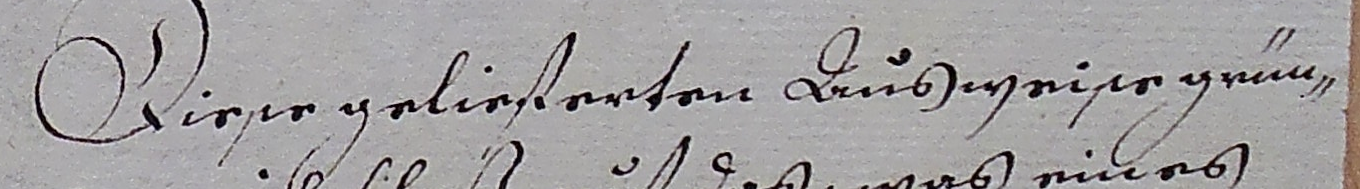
Diese gelieferten Ausweise grün¬
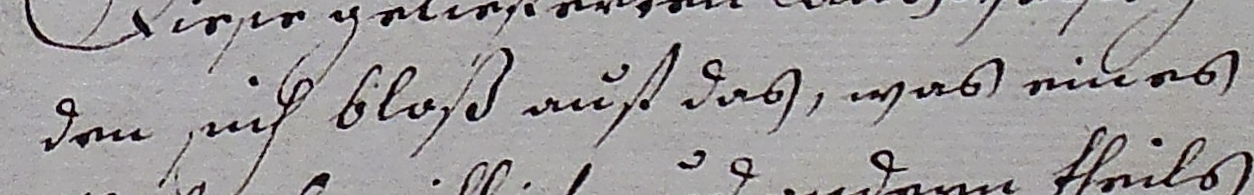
den sich bloß auf das, was eines
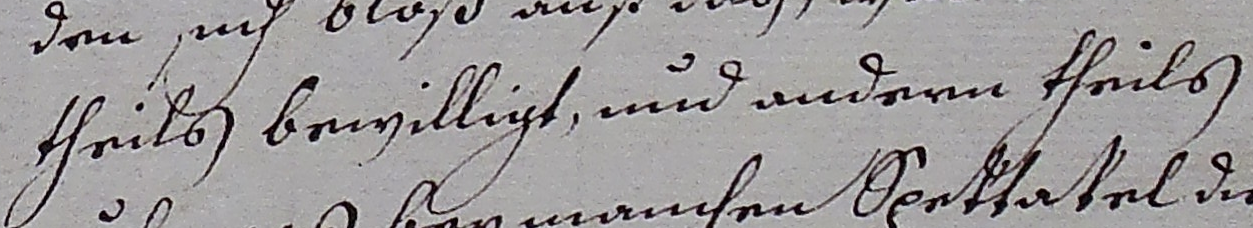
theils bewilligt, und andern theils
